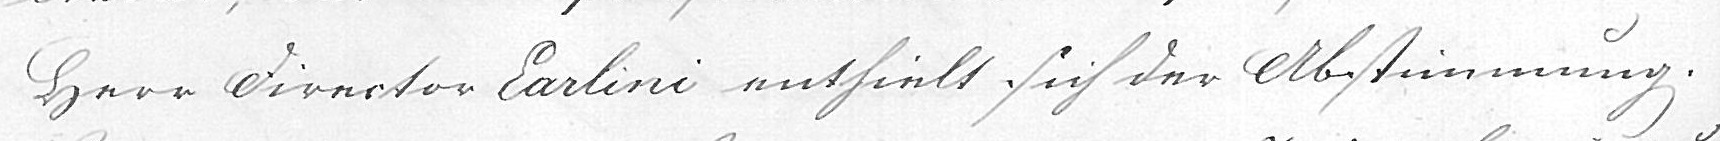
Herr Director Carlini enthielt sich der Abstimmung.
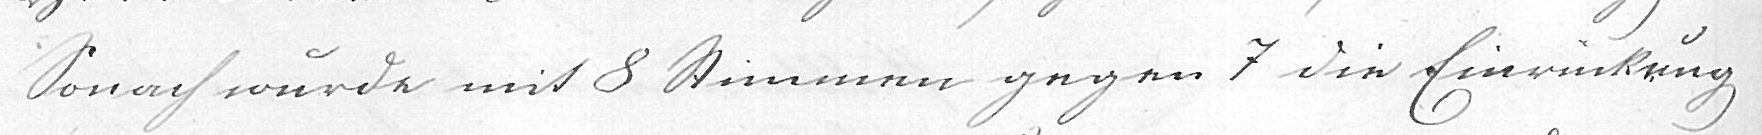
Sonach wurd mit 8 Stimmen gegen 7 die Einrückung
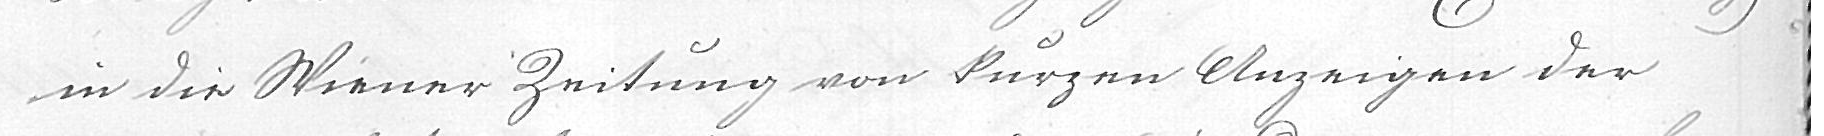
in die Wiener Zeitung von kurzen Anzeigen der
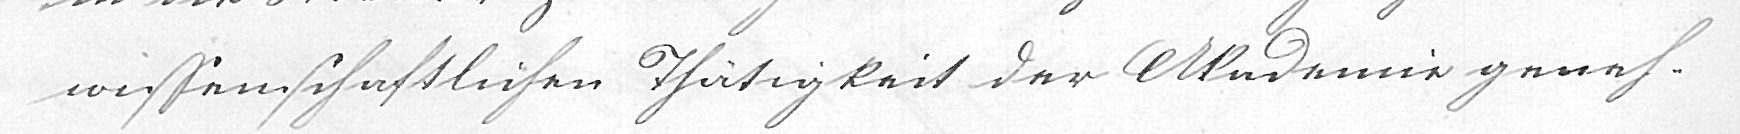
wissenschaftlichen Thätigkeit der Akademie geneh-
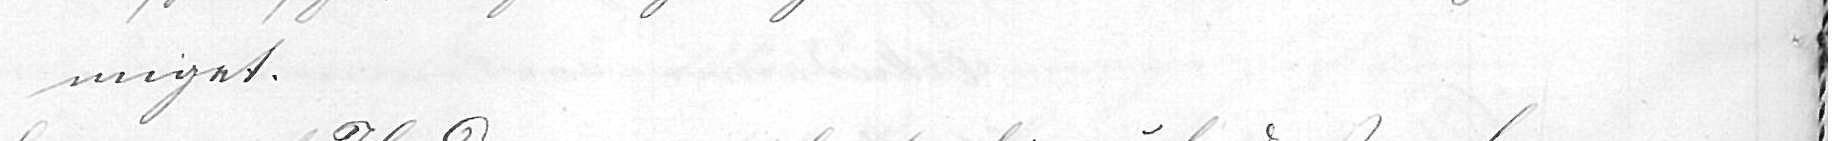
miget.
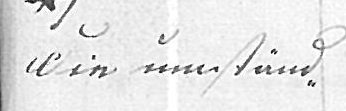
Die umständ-
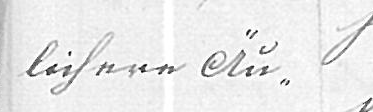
lichere Äu-
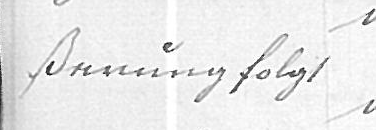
ßerung folgt
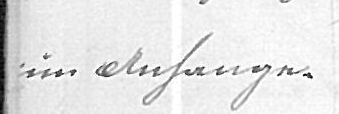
im Anhange
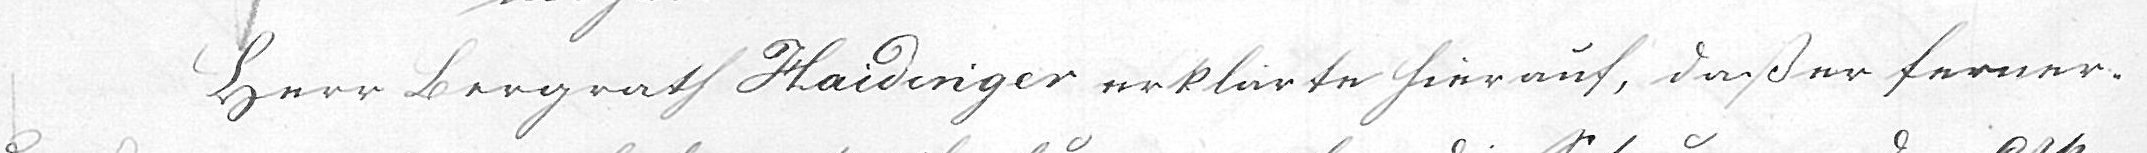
Herr Bergrath Haidinger erlärte hierauf, daß er ferner-
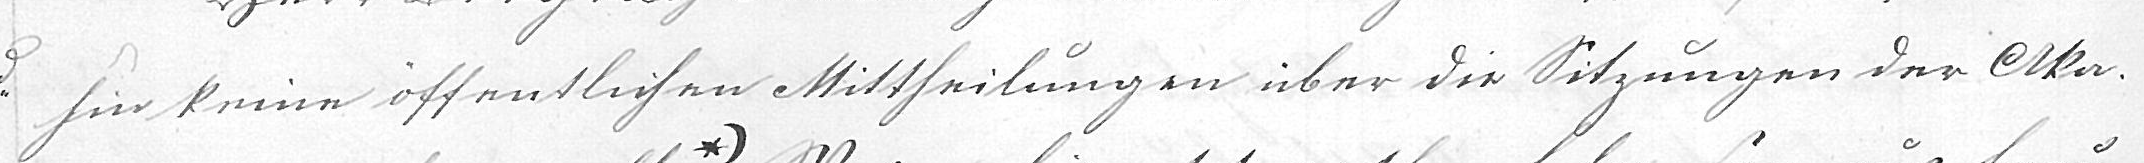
hin keine öffentlichen Mittheilungen über die Sitzungen der Aka-
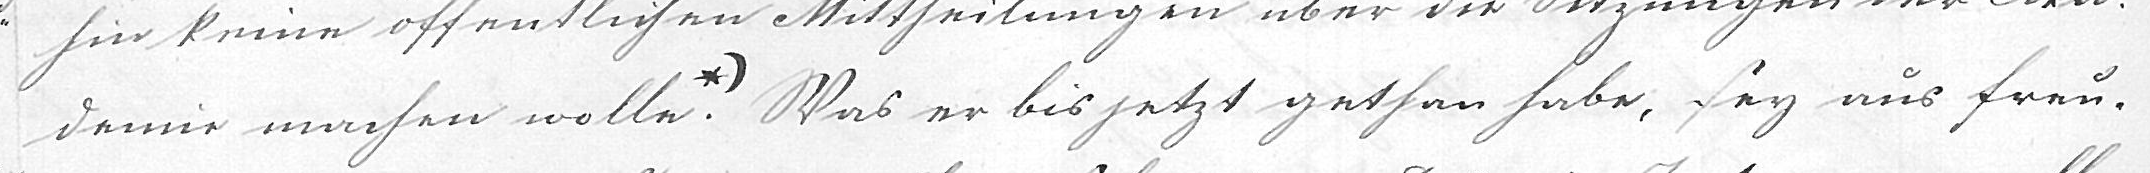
demie machen wolle. Was er bis jetzt gethan habe, sey aus freu-
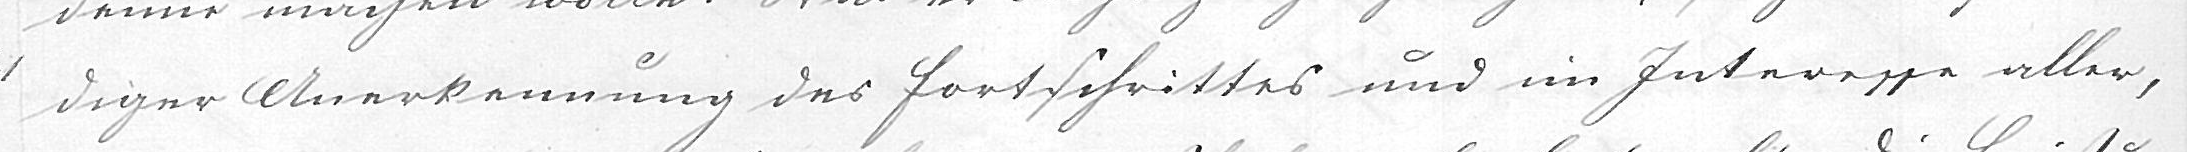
diger Anerkennung des Fortschrittes und im Interesse aller,
